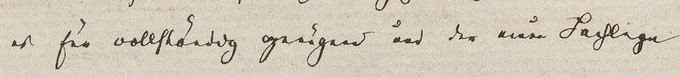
es für vollständig genügend und der neuen Sachlage
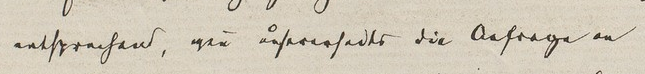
entsprechend, wenn unsererseits die Anfrage an
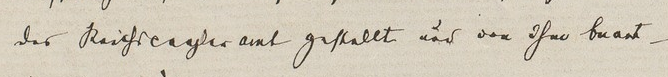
das Reichscanzleramt gestellt und von ihm beant-
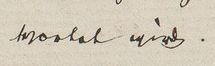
wortet wird.
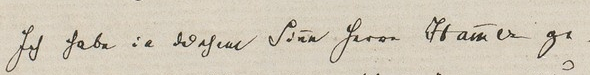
Ich habe in diesem Sinne Herrn Hammer ge-
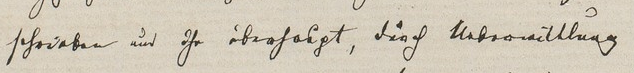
schrieben und ihn überhaupt, durch Uebermittlung
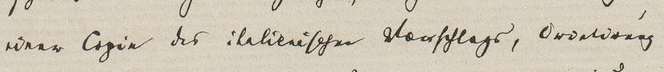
einer Copie des italienischen Vorschlags, Orietirung
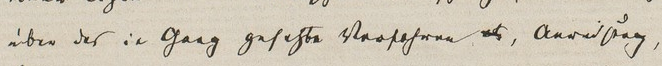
über das in Gang gesetzte Verfahren etc, Anweisung,
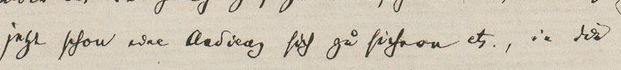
jetzt schon eine Audienz sich zu sichern etc., in die
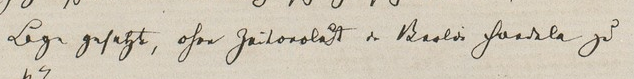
Lage gesetzt, ohne Zeitverlust in Berlin handeln zu
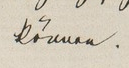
können.
